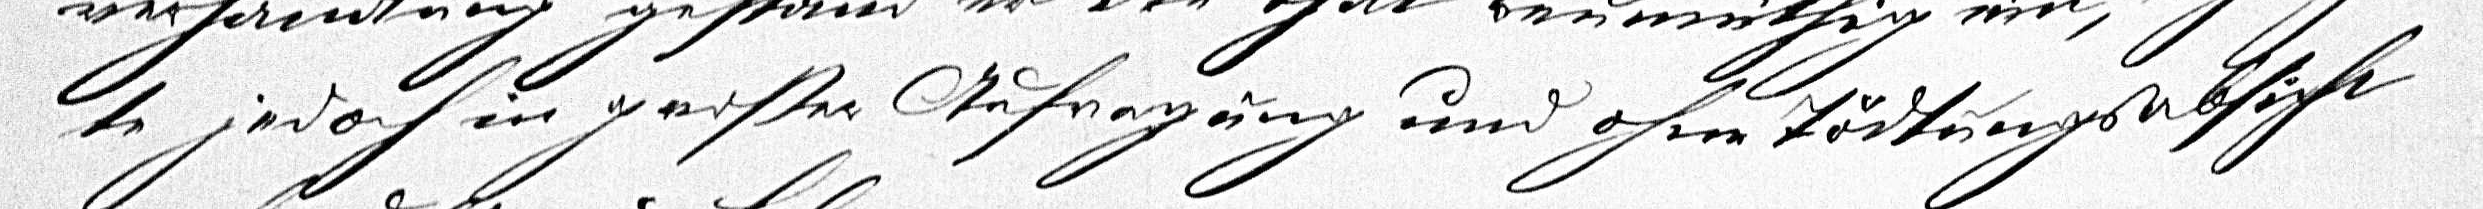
te jedoch in großer Aufregung und ohne Tödtungsabsicht
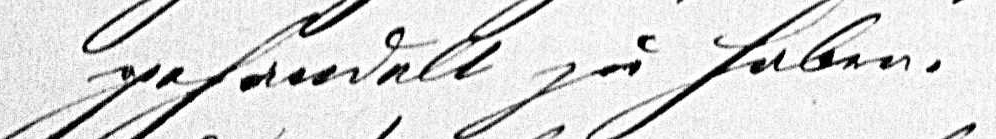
gehandelt zu haben.
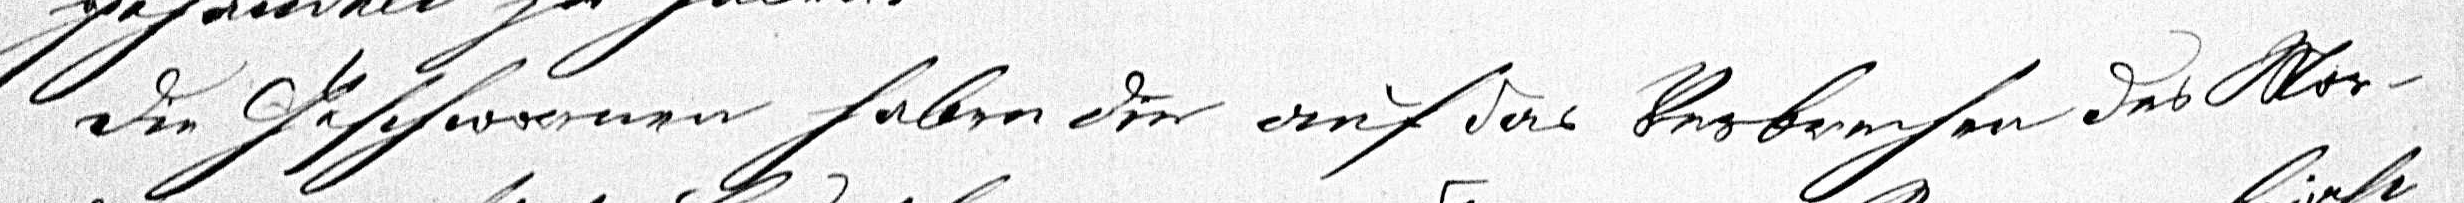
Die Geschwornen haben die auf das Verbrechen des Mor¬
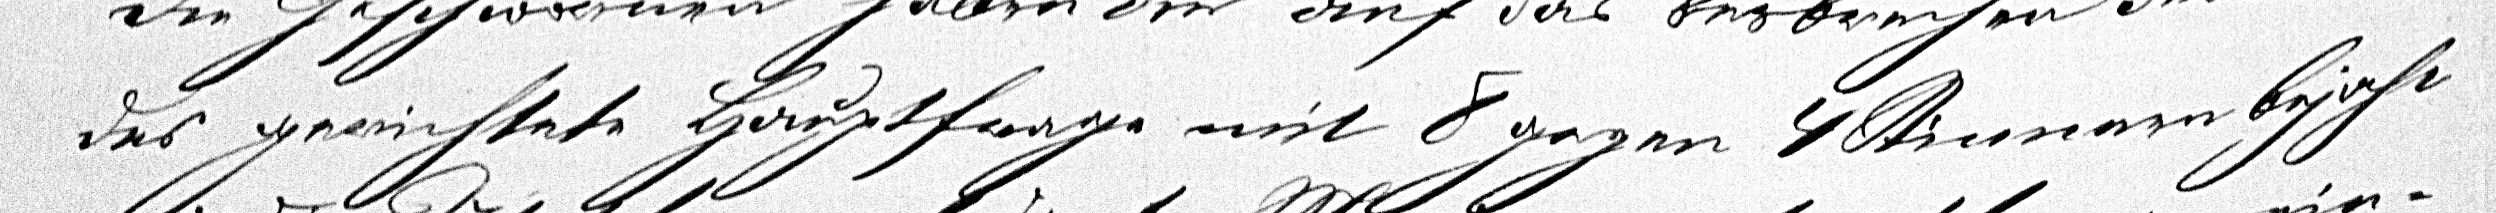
des gerichtete Hauptfrage mit 8 gegen 4 Stimmen bejaht
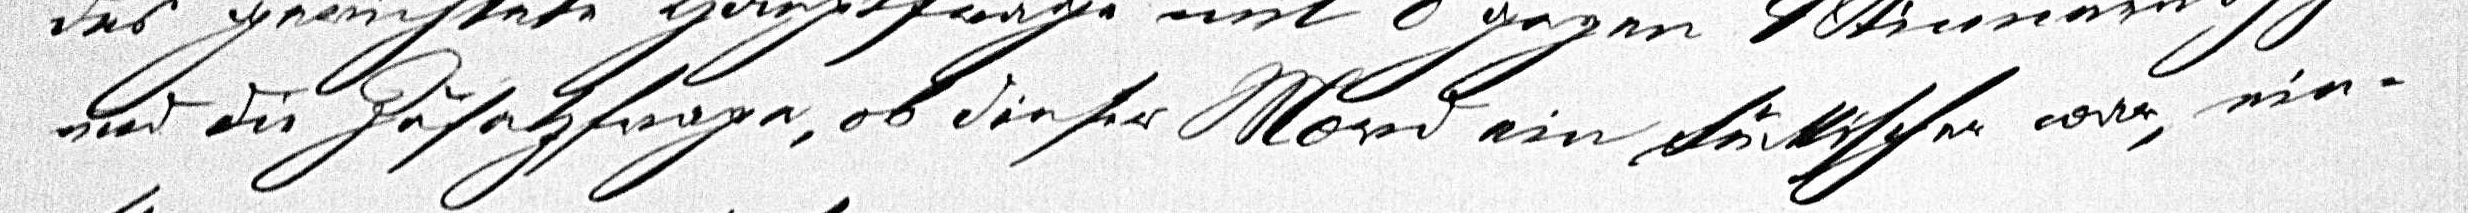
und die Zusatzfrage, ob dieser Mord ein tückischer war, ein¬
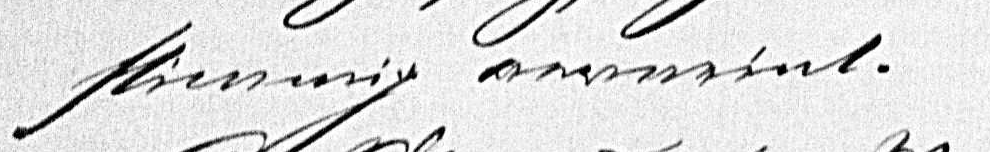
stimmig verneint.
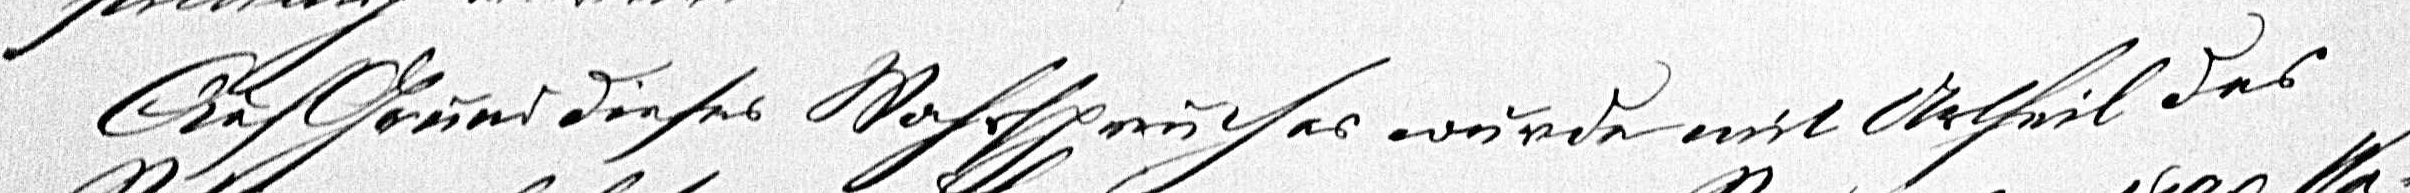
Auf Grund dieses Wahrspruches wurde mit Urtheil das
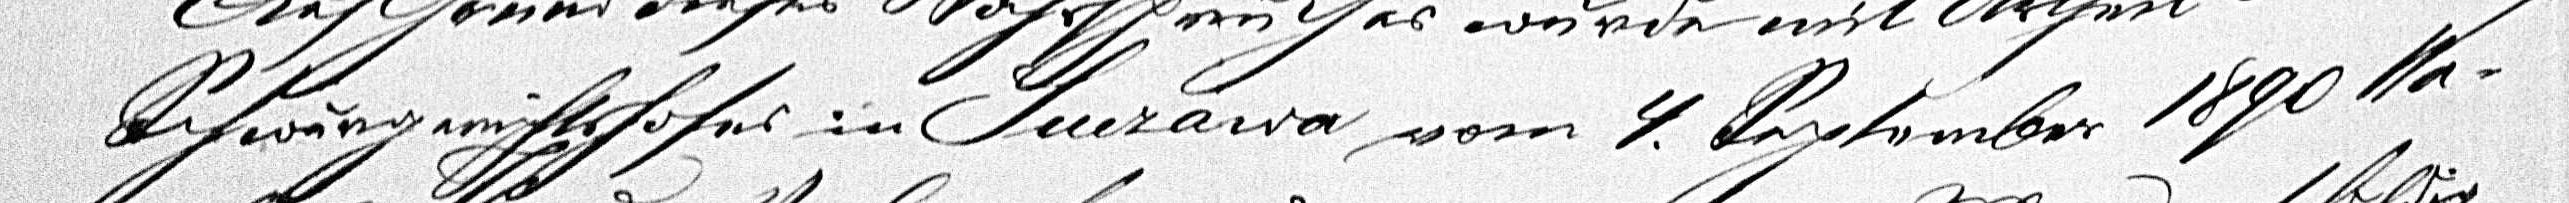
Schwurgerichtshofes in Suczawa vom 4. September 1890 Wa¬
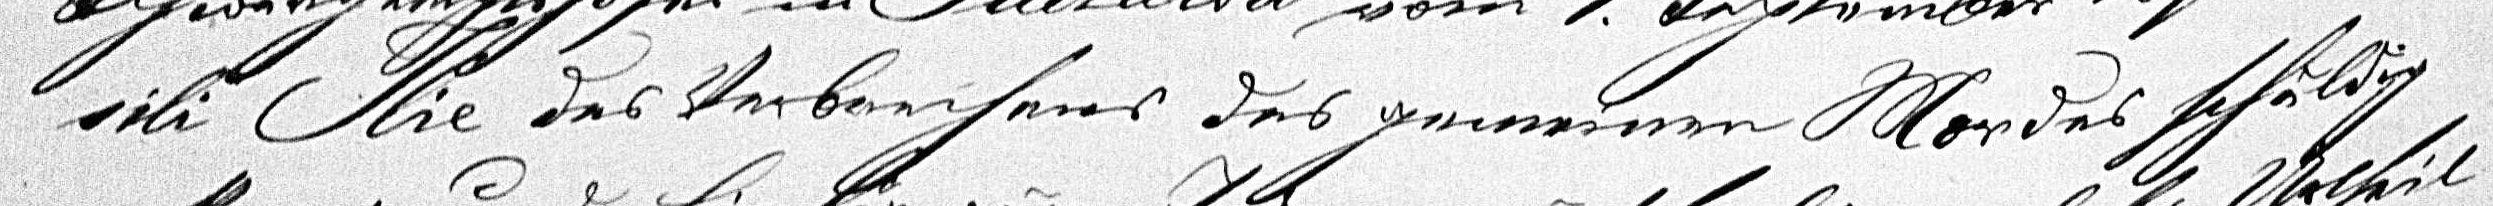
sili Jlie des Verbrechens des gemeinen Mordes schuldig
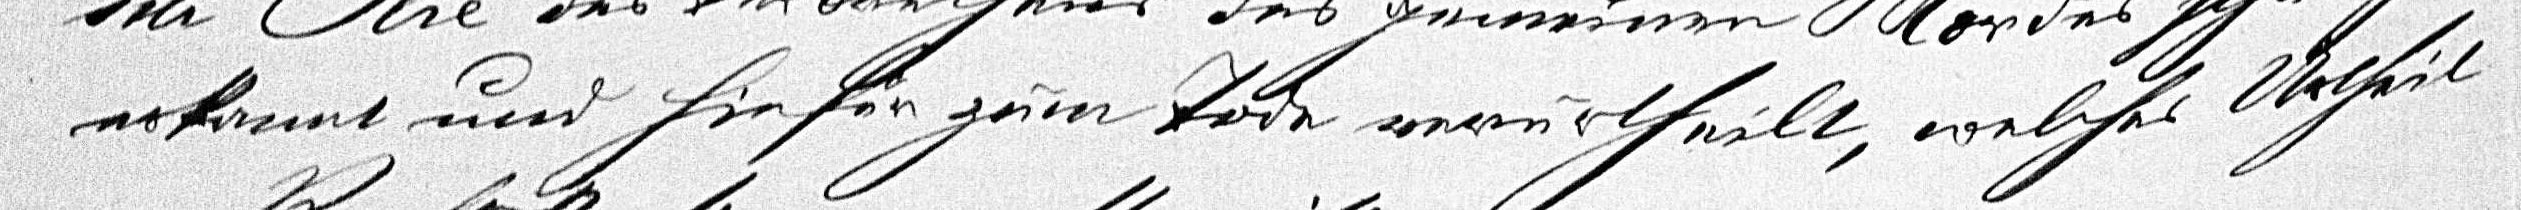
erkannt und hiefür zum Tode verurtheilt, welches Urtheil
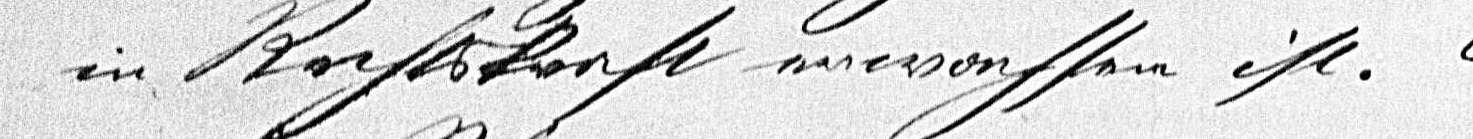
in Rechtskraft erwachsen ist.
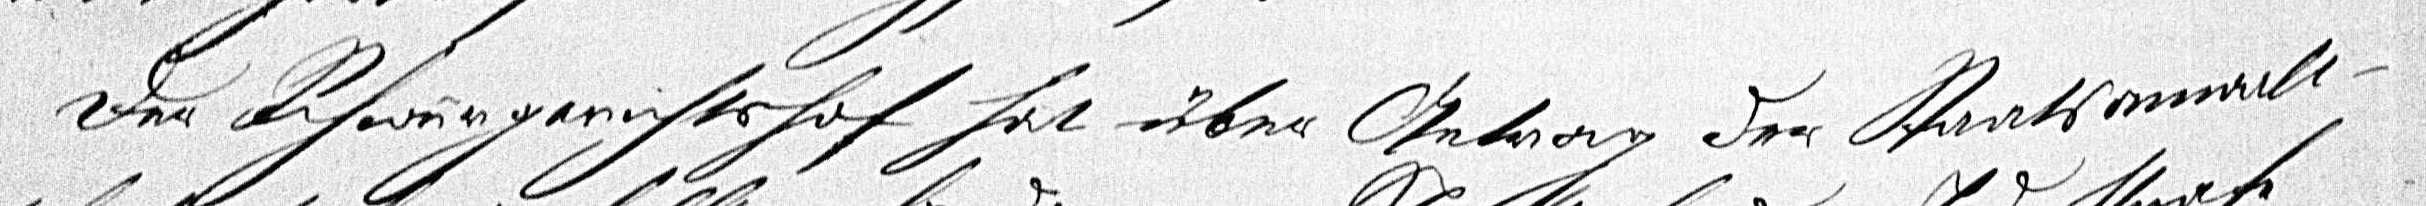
Der Schwurgerichtshof hat über Antrag der Staatsanwalt¬
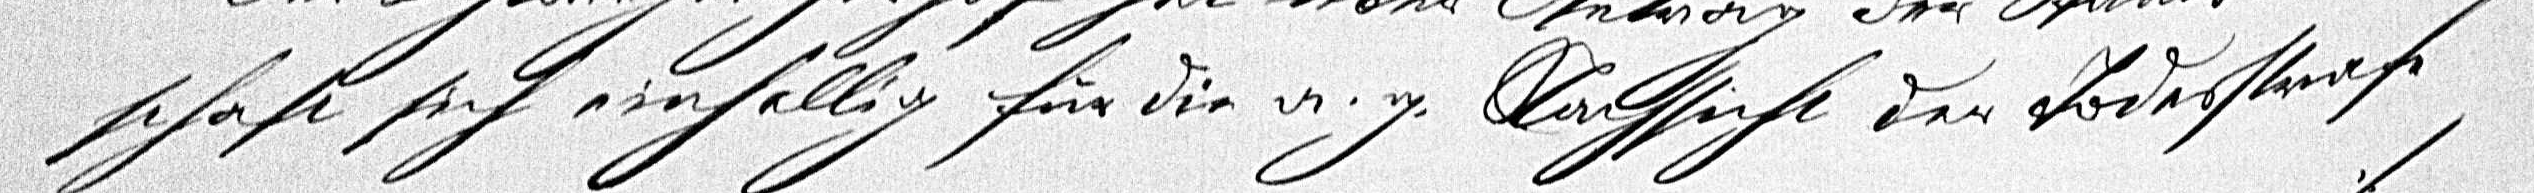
schaft sich einhellig für die a. g. Sachsicht der Todesstrafe
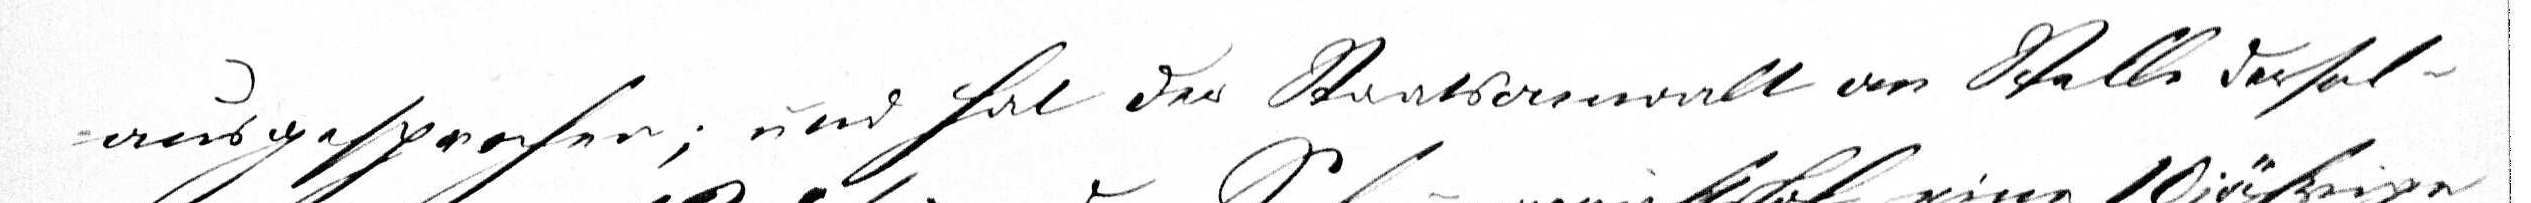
ausgesprochen; und hat der Staatsanwalt an Stelle dersel¬
